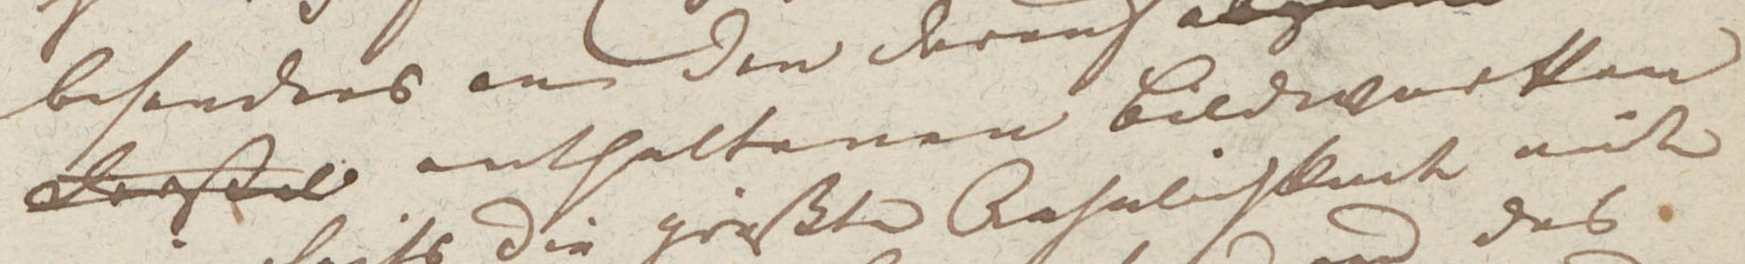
Darstel enthaltenen Bildwerken
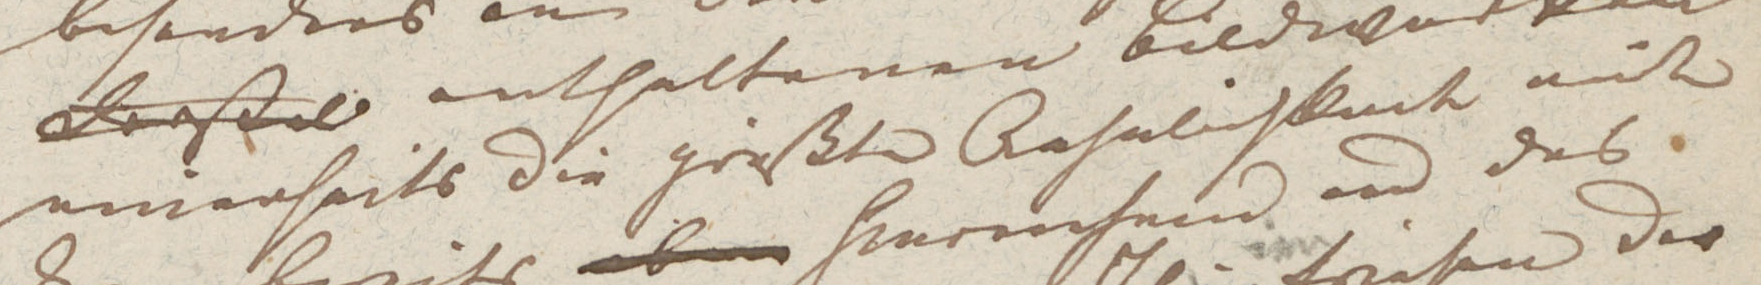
einerseits die grösste Aehnlichkeit mit
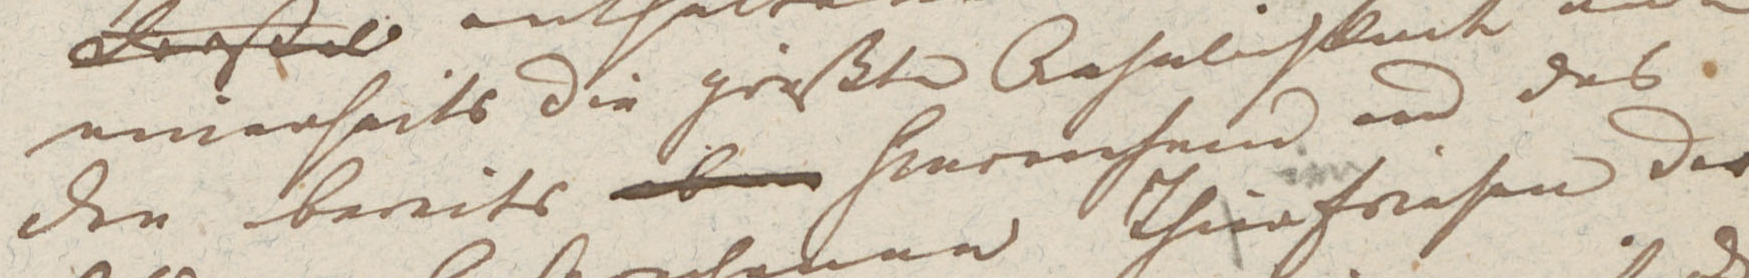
den bereits oben hinreichend und des
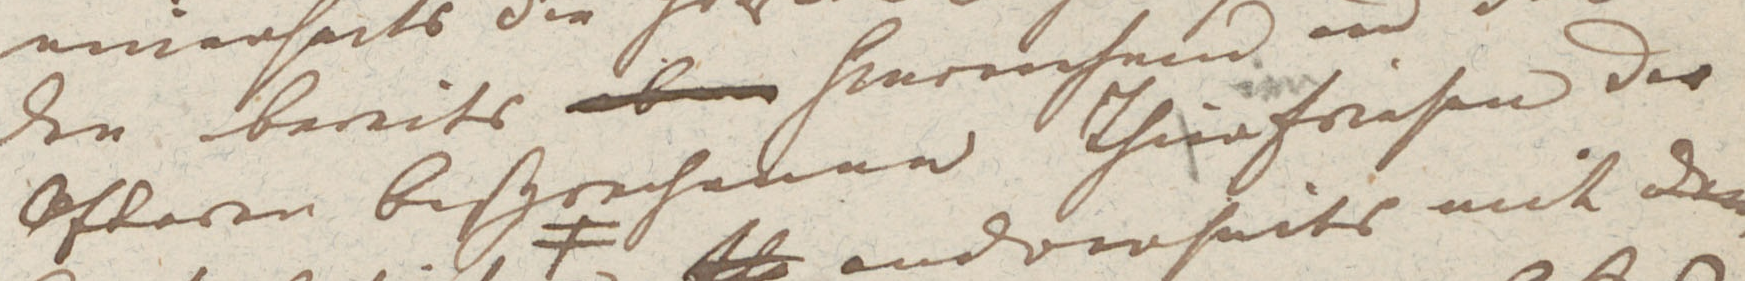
Ofteren besprochenen Thierierfriesen der
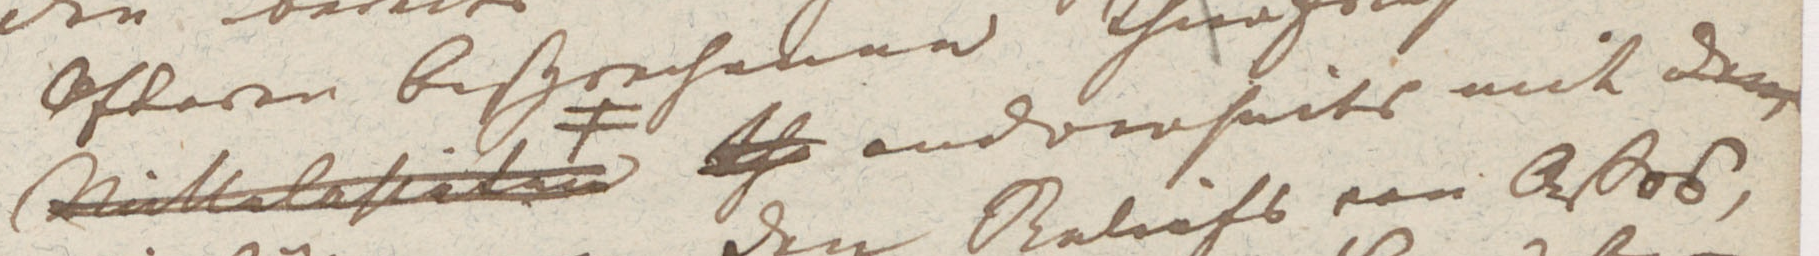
Mittelasiaten % th andrerseits mit dem
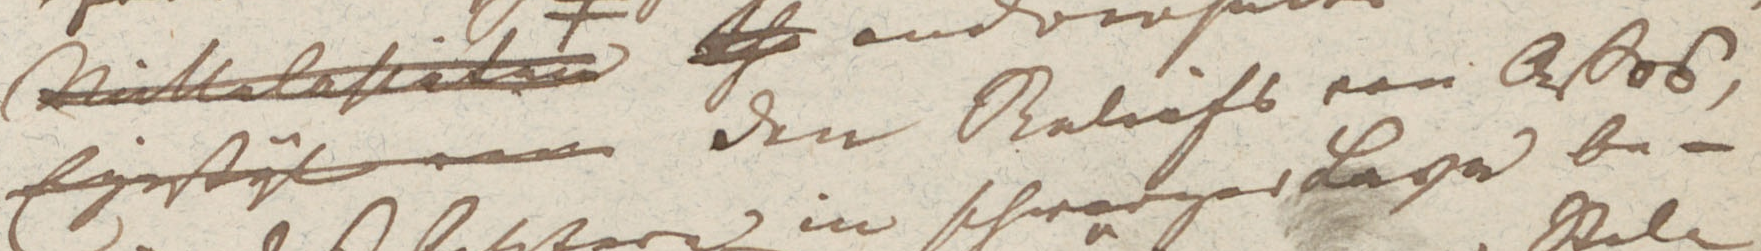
Epistyl von den Reliefs von Assos,
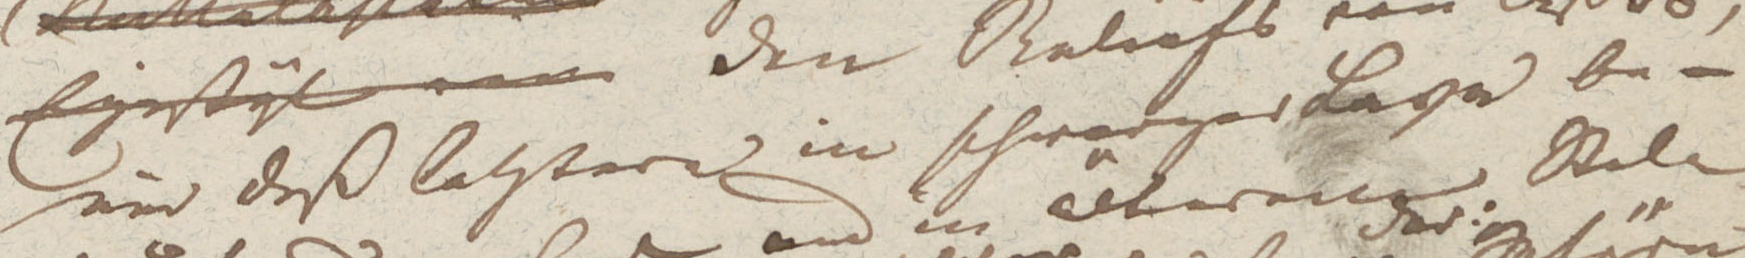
nur dass letztere in schwarzer Lava be-
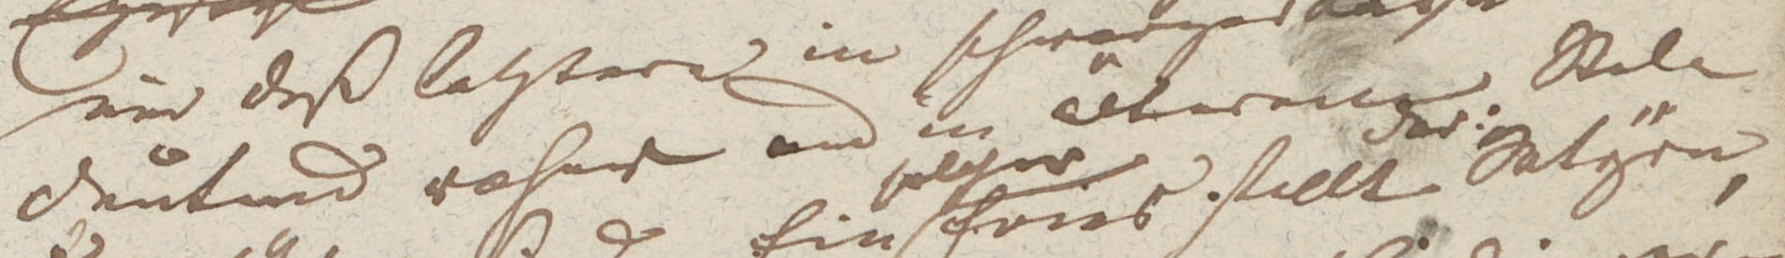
deutend roher und in älterem Stile
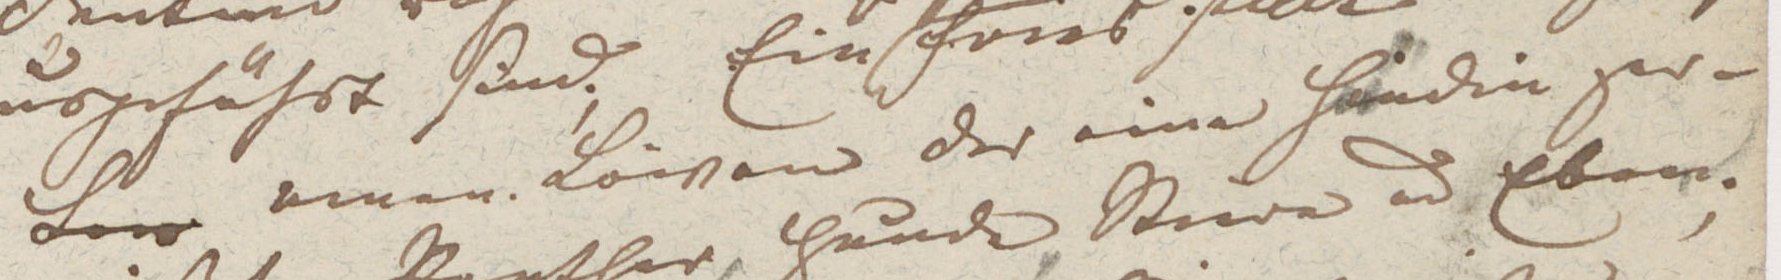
Low einen Löwen der eine Hiündin zer-
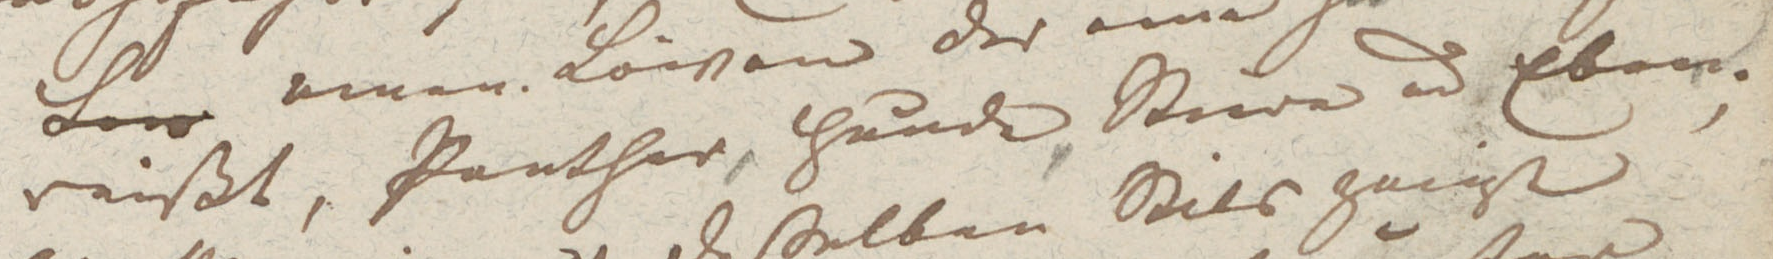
reisst, Panther, Hunde, Stiere und Ebenr;
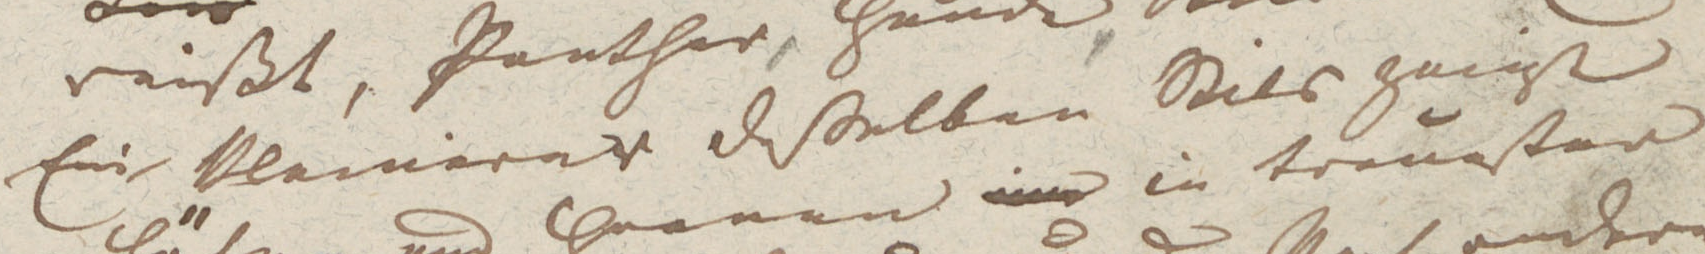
Ein kleinerer desselben Stils zeigt
